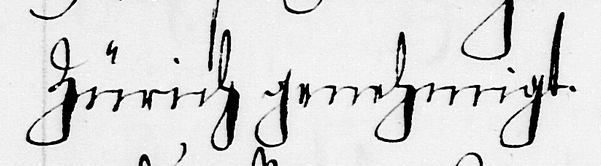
Zürich genehmigt.
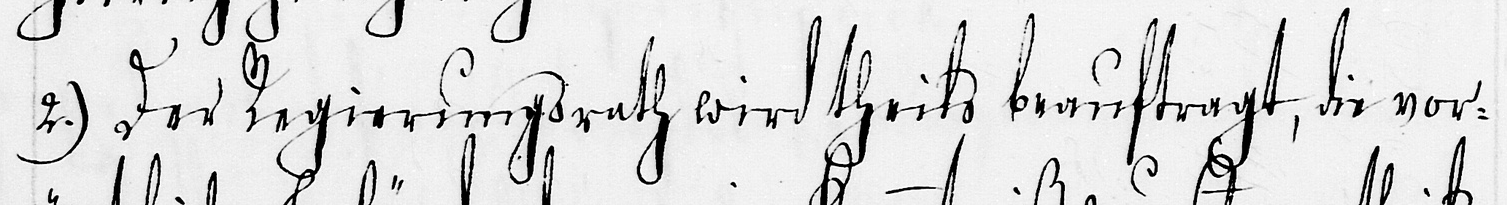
2.) Der Regierungsrath wird theils beauftragt, die vor¬
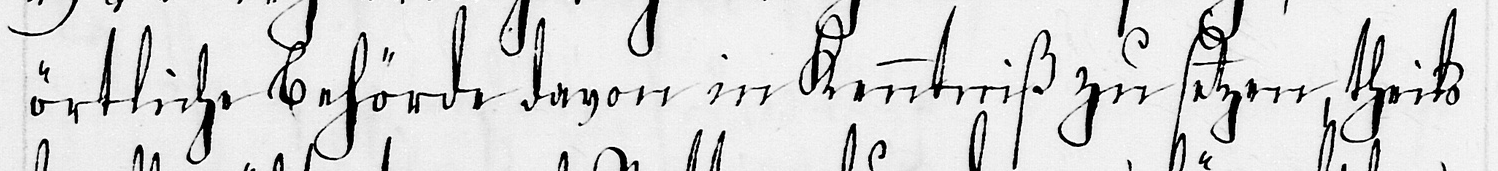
örtliche Behörde davon in Kenntniß zu setzen, theils
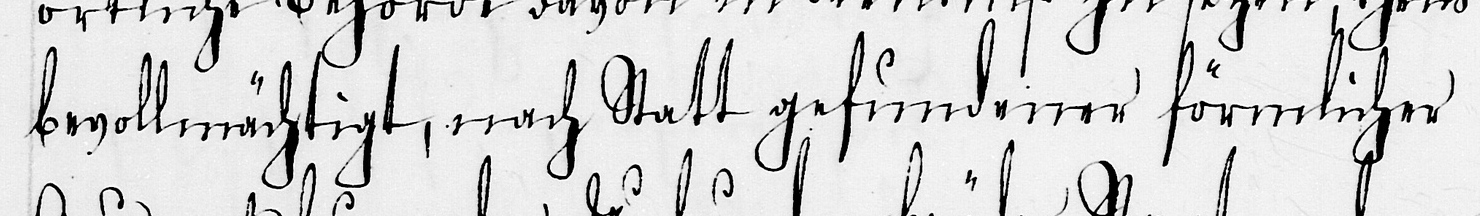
bevollmächtigt, nach Statt gefundener förmlicher
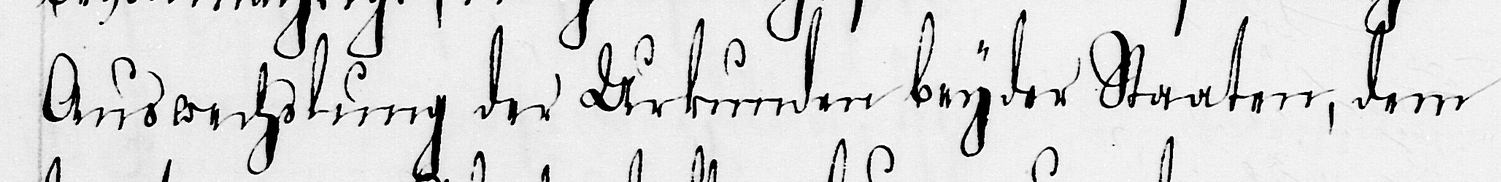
Auswechslung der Urkunden beyder Staaten, dem
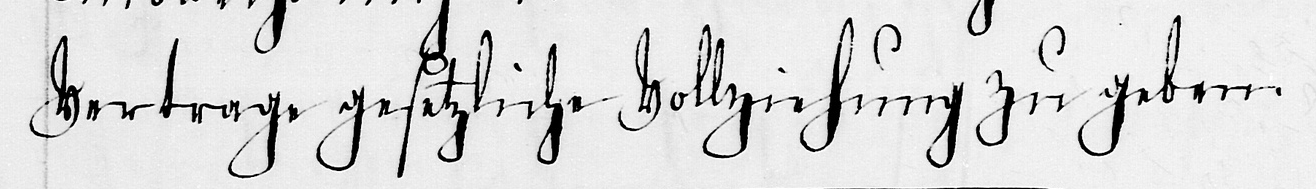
Vertrage gesetzliche Vollziehung zu geben.
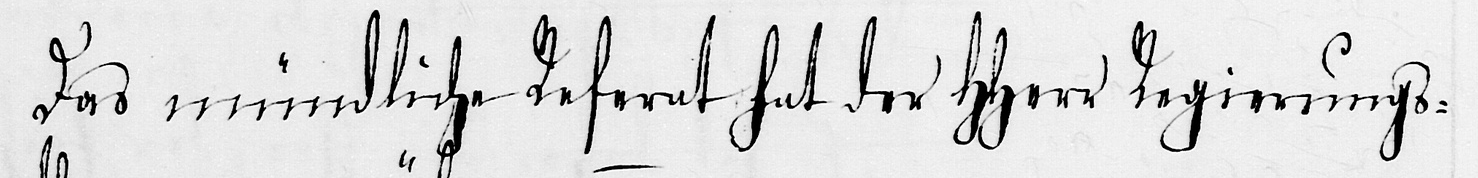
Das mündliche Referat hat der HHerr Regierungs¬
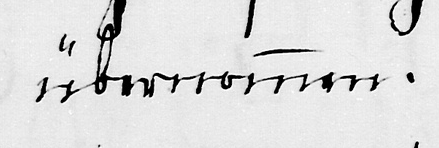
übernommen.
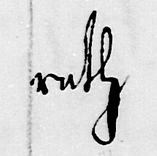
rath
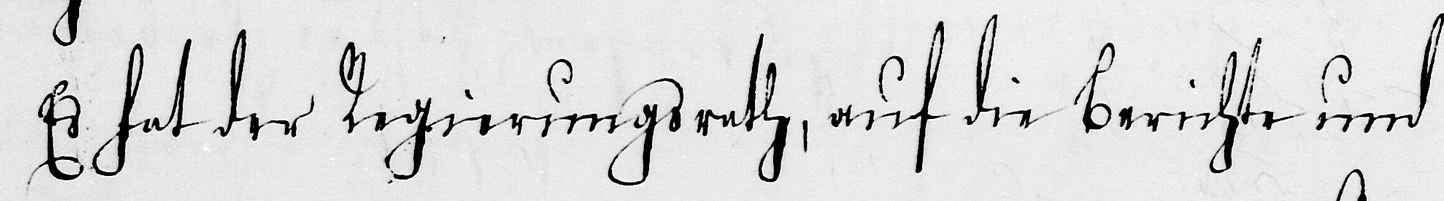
Es hat der Regierungsrath, auf die Berichte und
